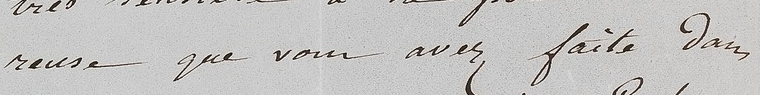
reuse que vous avez faite dans
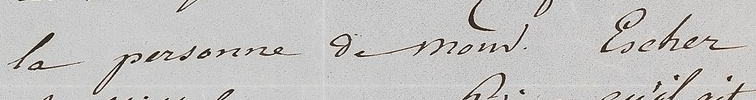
la personne de Mons. Escher
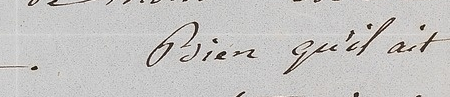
Bien qu'il ait
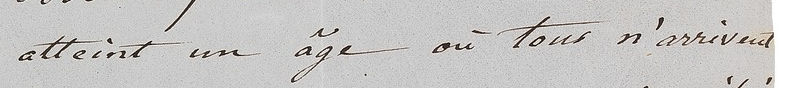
atteint un âge où tous n'arrivent
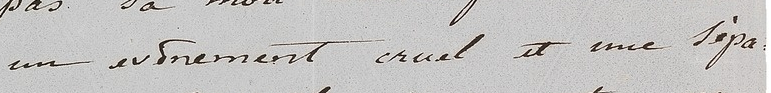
un evènement cruel et une sépa-
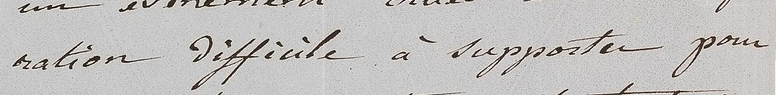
ration difficile à supporter pour
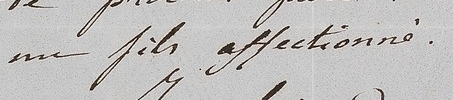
un fils affectionné.
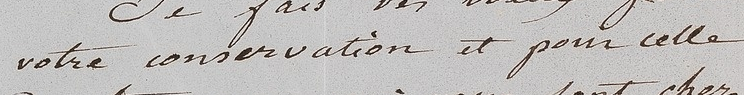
votre conservation et pour celle
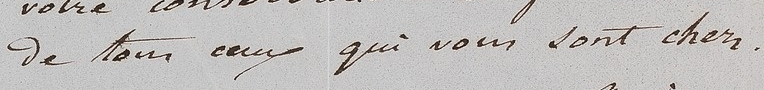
de tous ceux qui vous sont cher.
